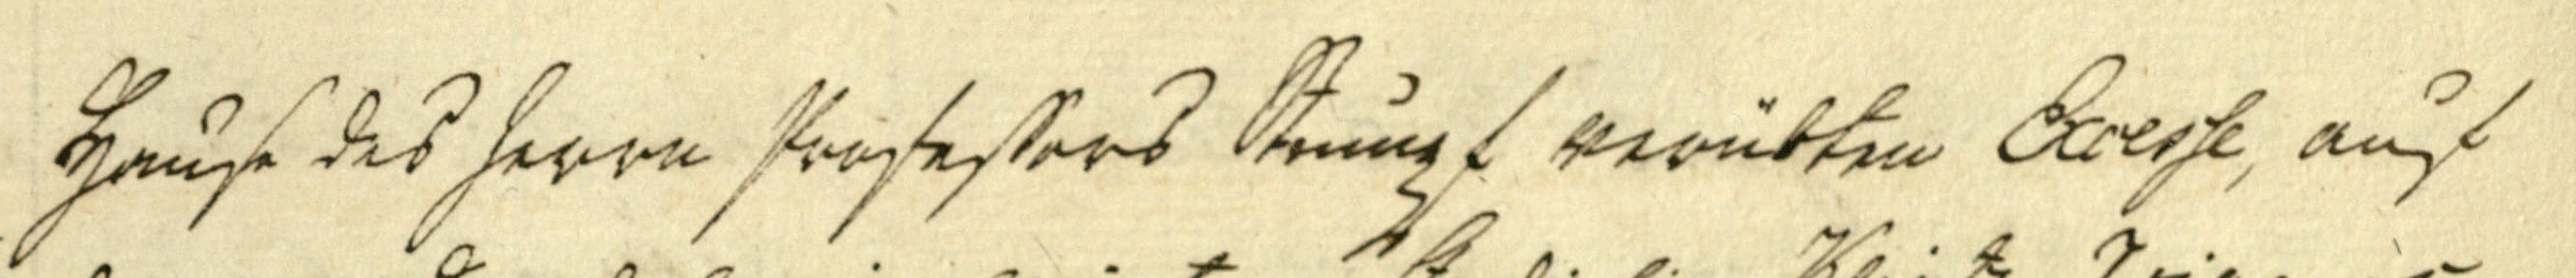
Hause des Herrn Professors Stumpf verübten Excesse, auf
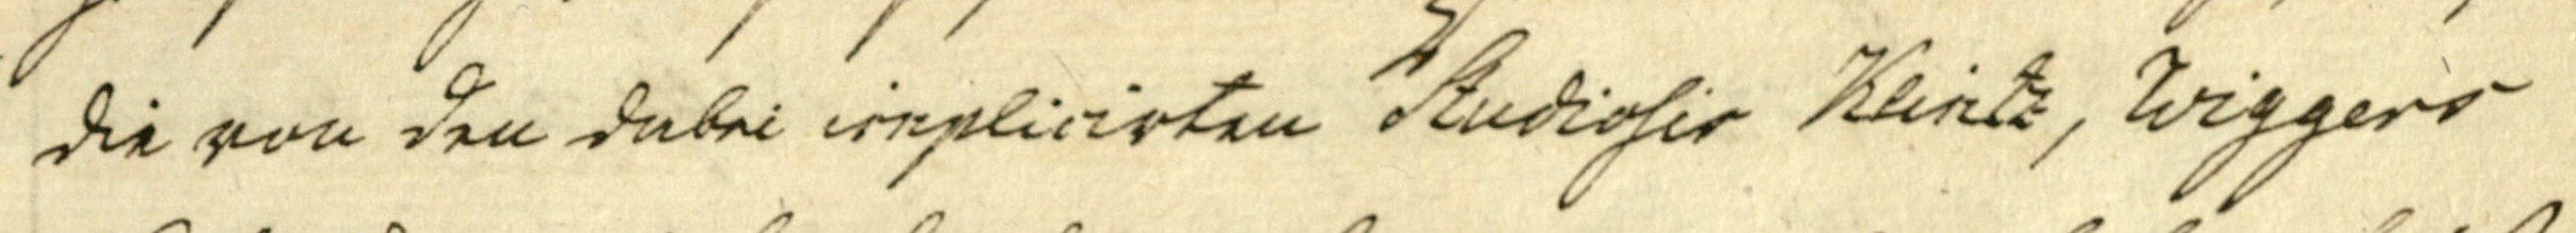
die von den dabei implicirten Studiosis Klintz, Wiggers
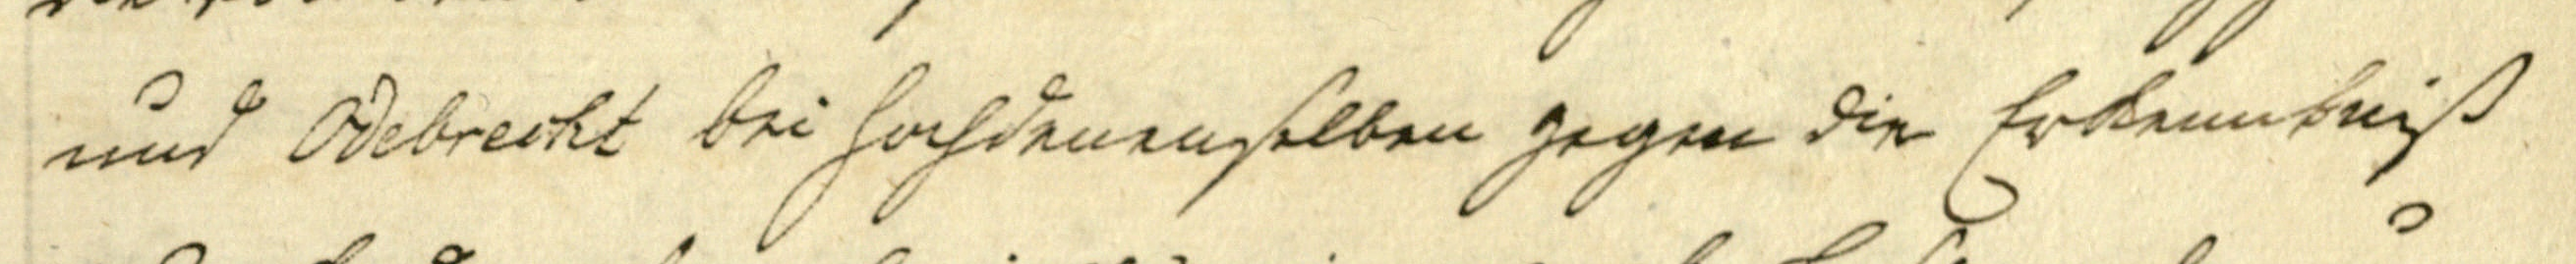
und Odebrecht bei hochdenenselben gegen die Erkenntniß
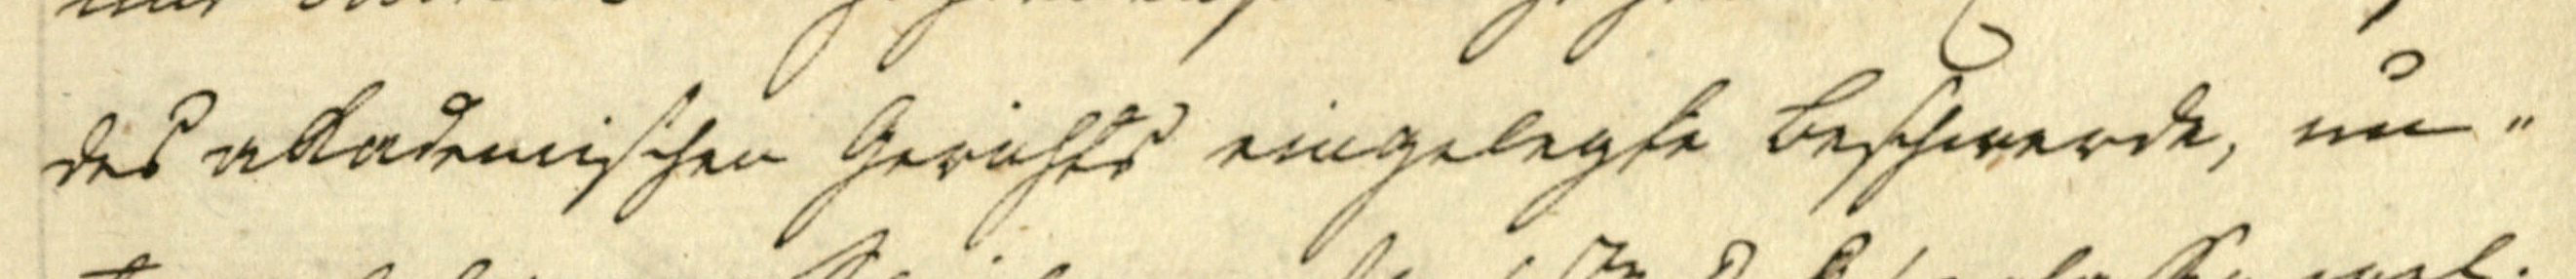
des akademischen Gerichts eingelegte Beschwerde, un¬
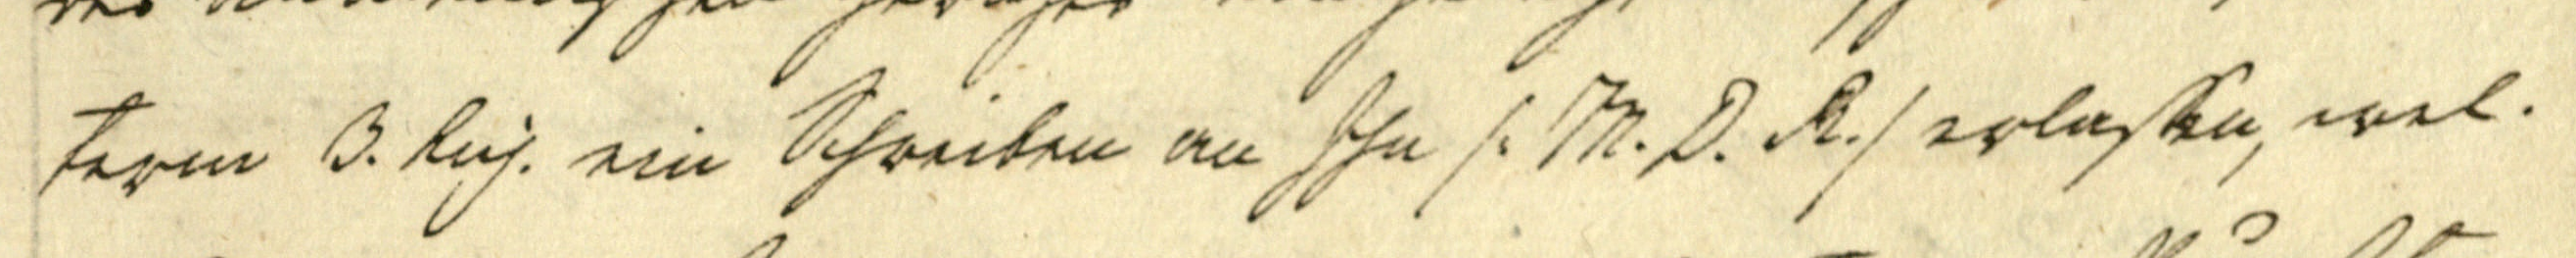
term 3. huj. ein Schreiben an Ihn /: M. D. R./ erlassen, wel¬
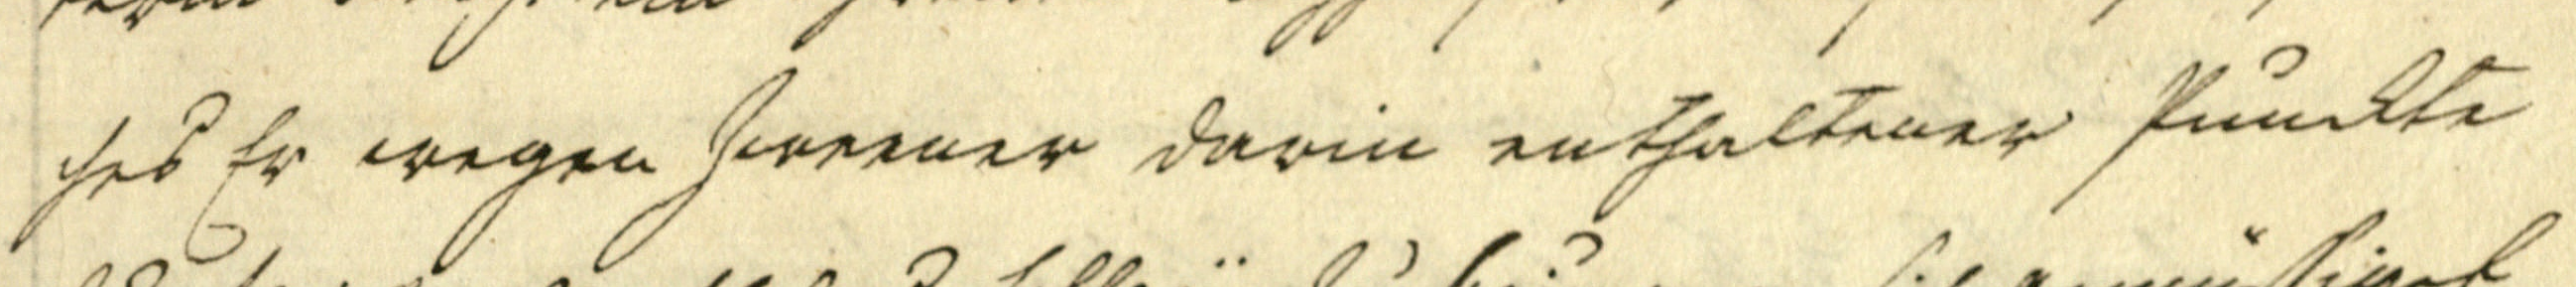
ches Er wegen zweener darin enthaltener Punckte
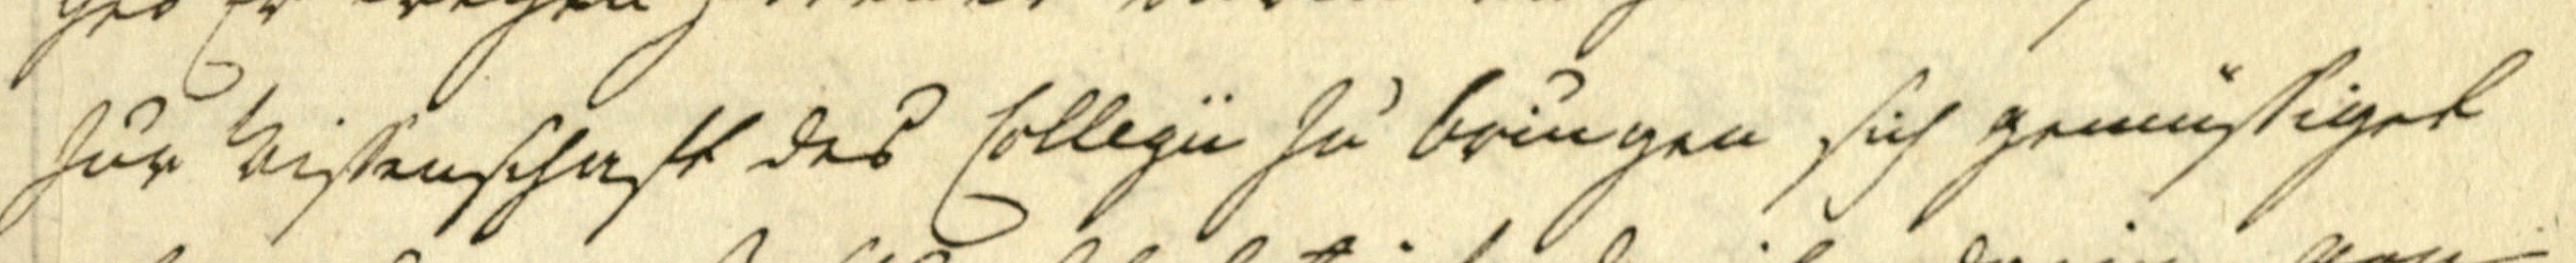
zur Wissenschaft des Collegii zu bringen sich gemüssiget
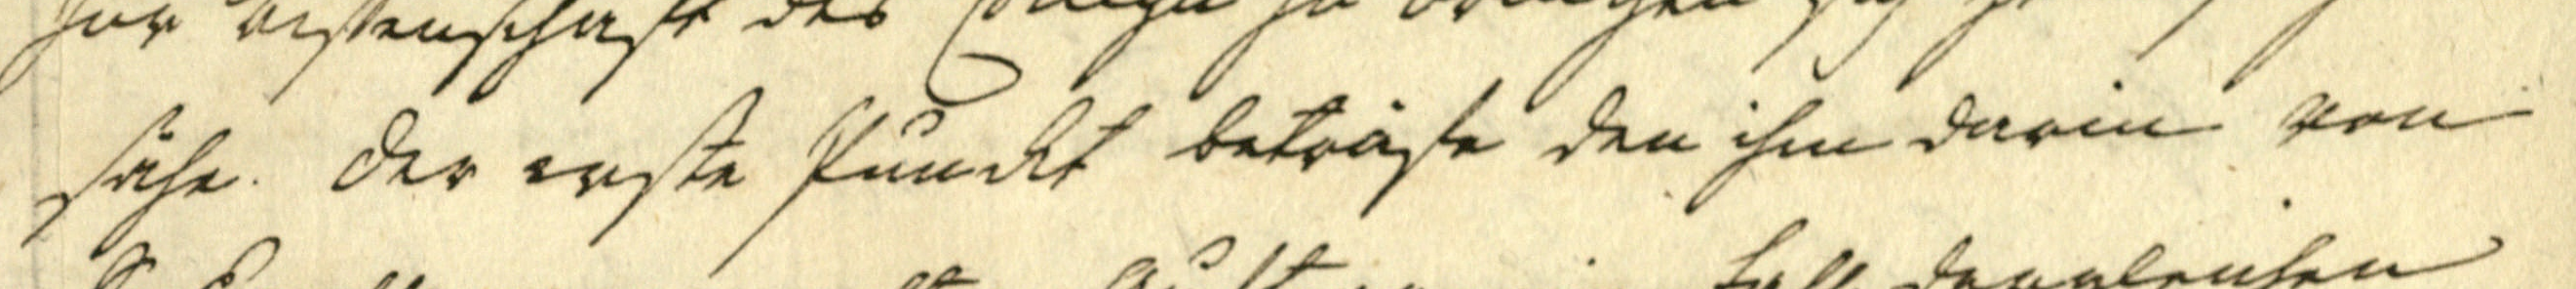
sähe. Der erste Punckt beträfe den ihm darin von
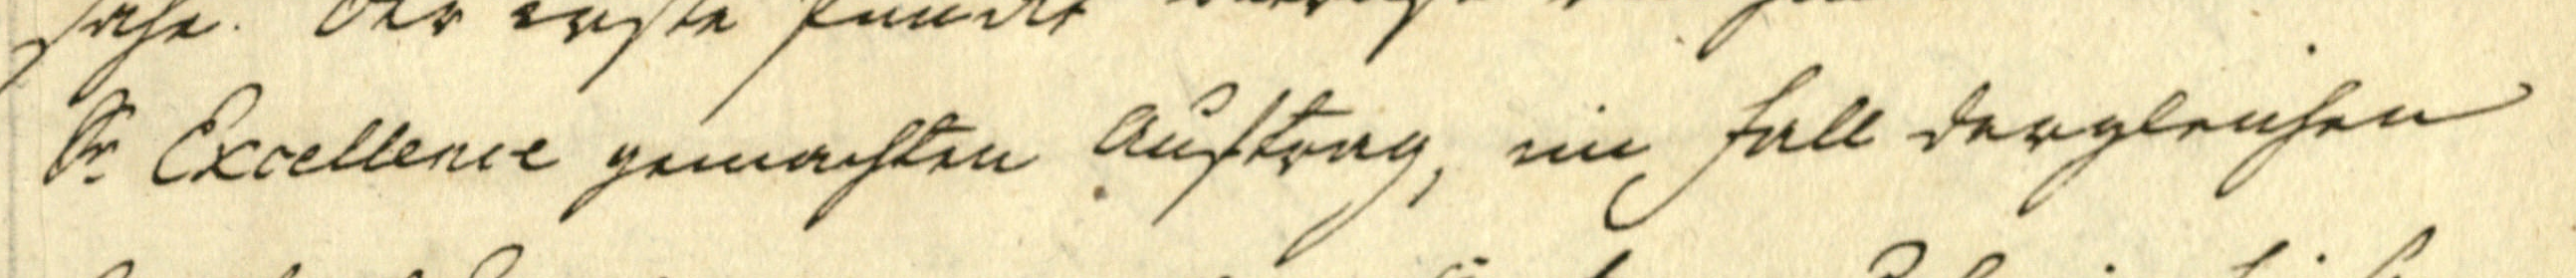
Sr. Excellence gemachten Auftrag, im Fall dergleichen
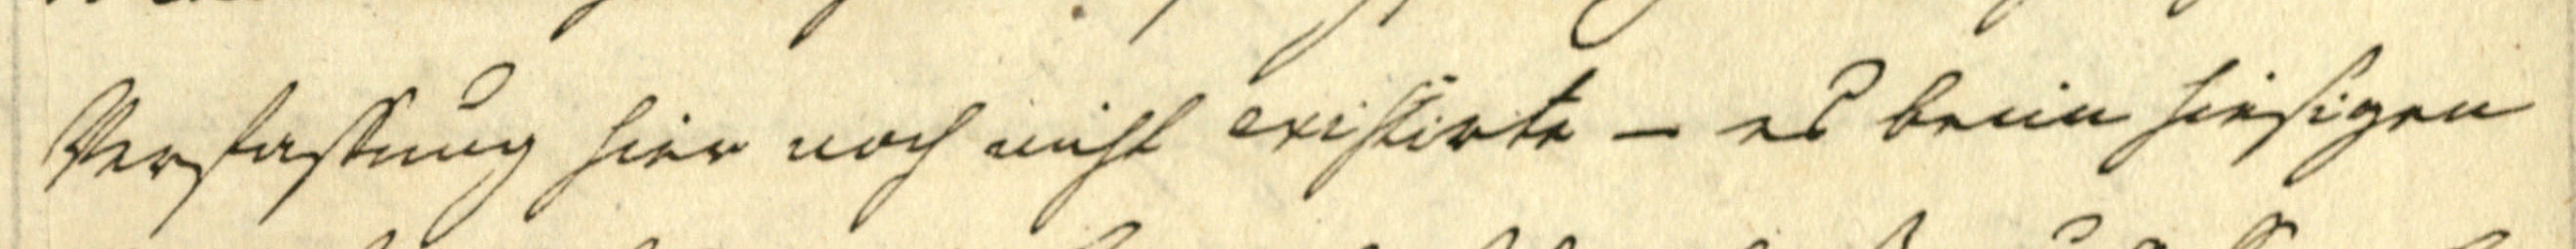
Verfassung hier noch nicht existirte - es beim hiesigen
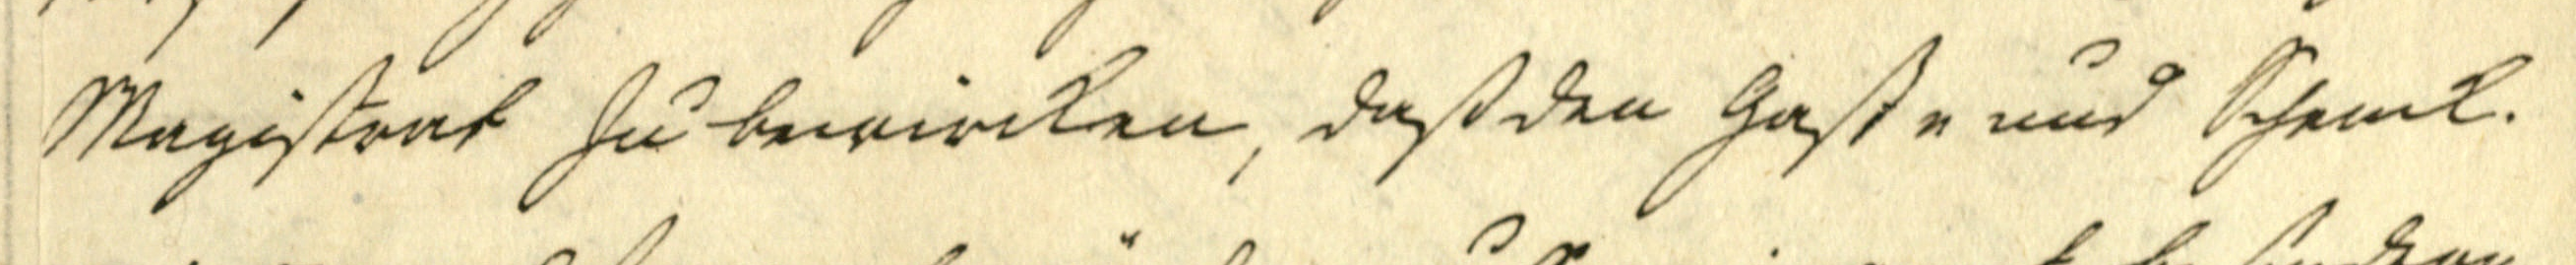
Magistrat zu bewircken, daß den Gast- und Schenck¬
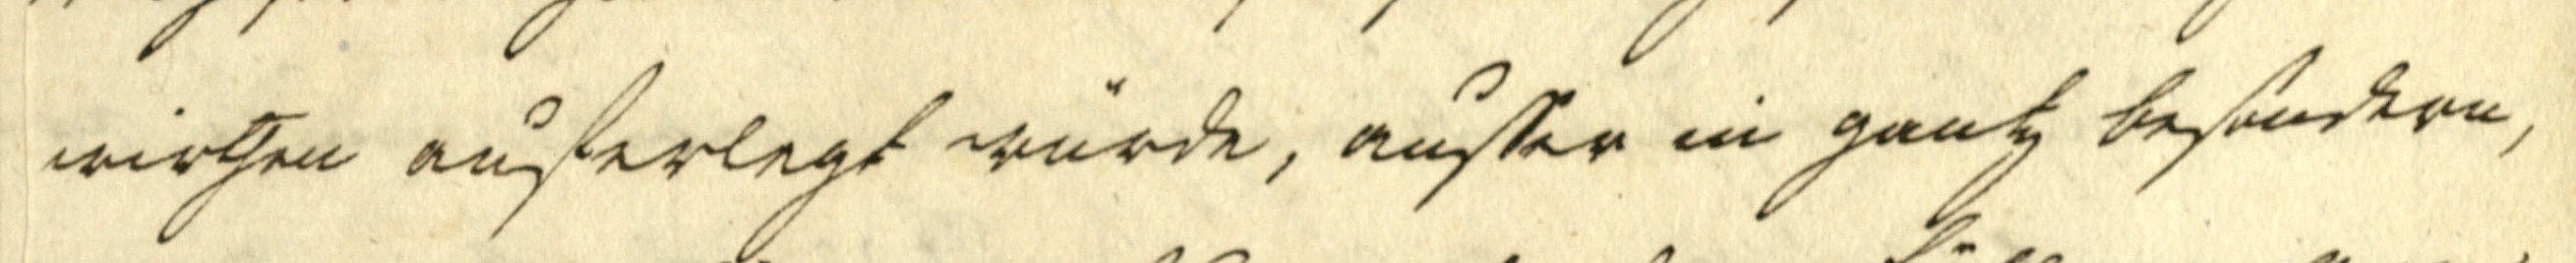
wirthen auferlegte würde, ausser in gantz besondern,
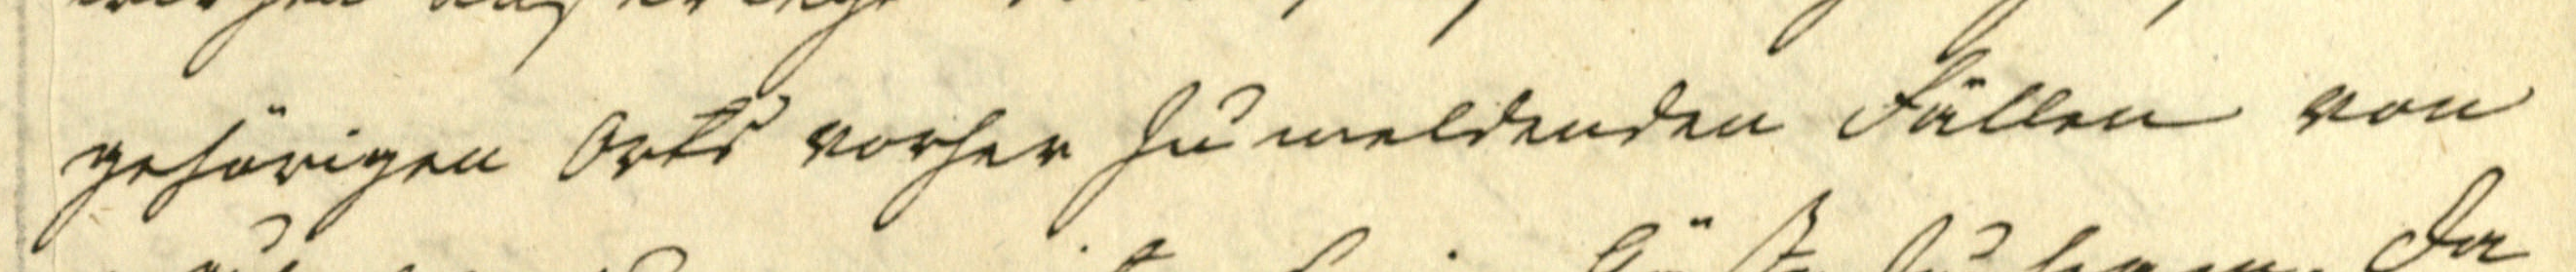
gehörigen Orts vorher zu meldenden Fällen von
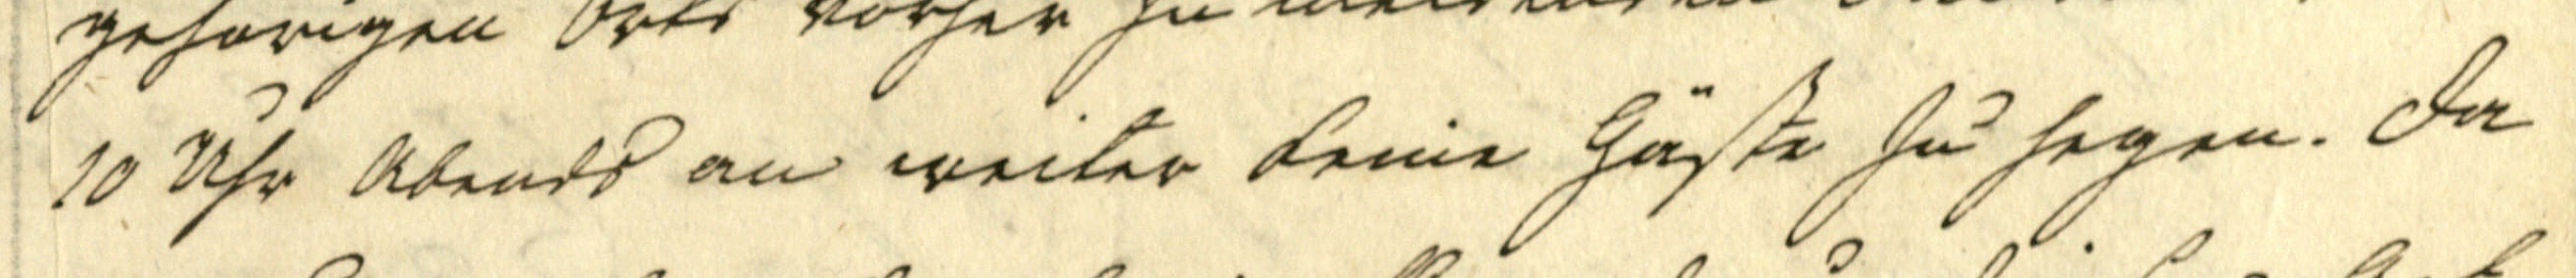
10 Uhr Abends an weiter keine Gäste zu hegen. Da
